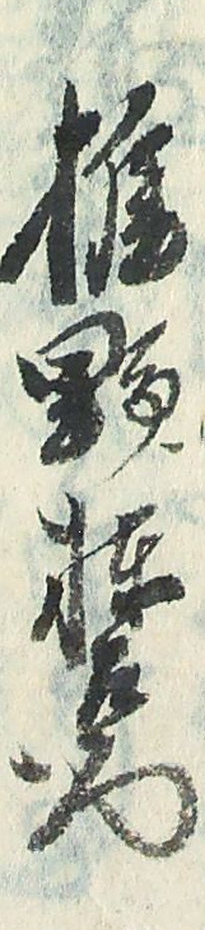梶野棟左衛門
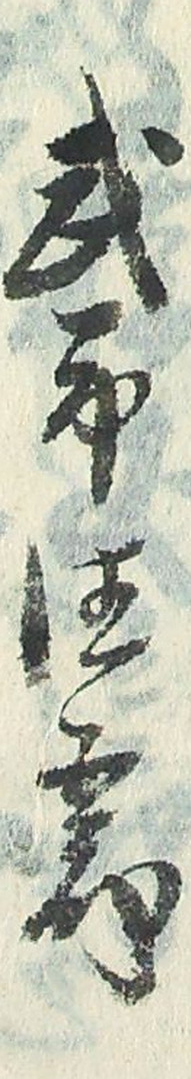武市徳五郎
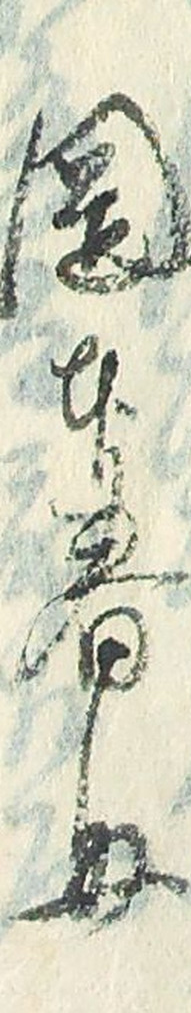岡本春助

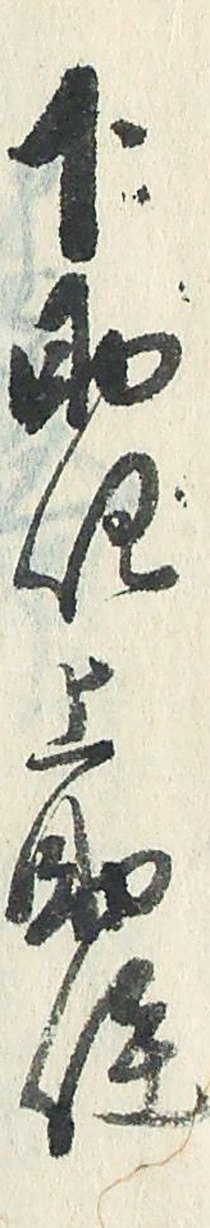下助任上助任
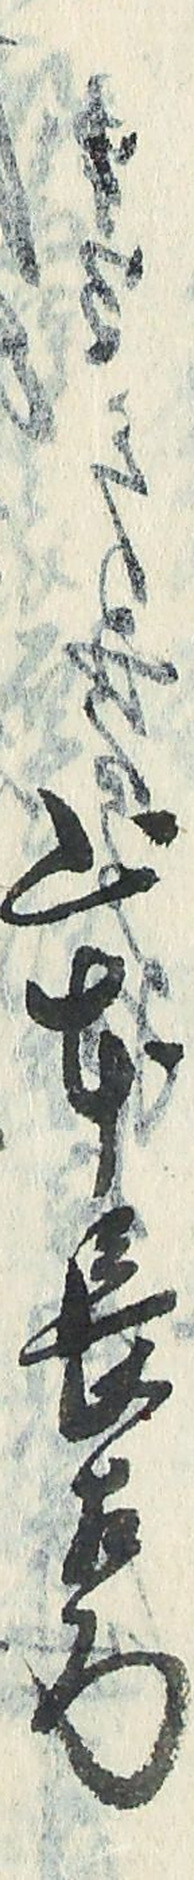山本長左衛門
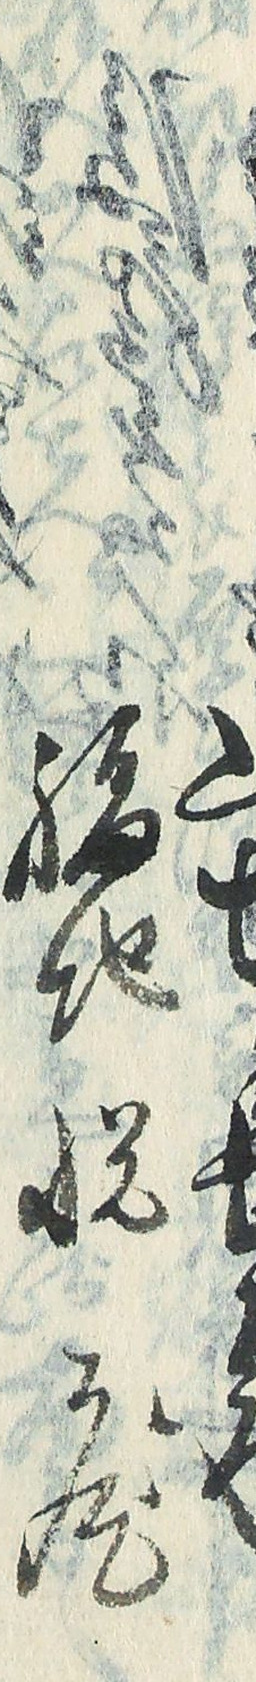福地悦蔵
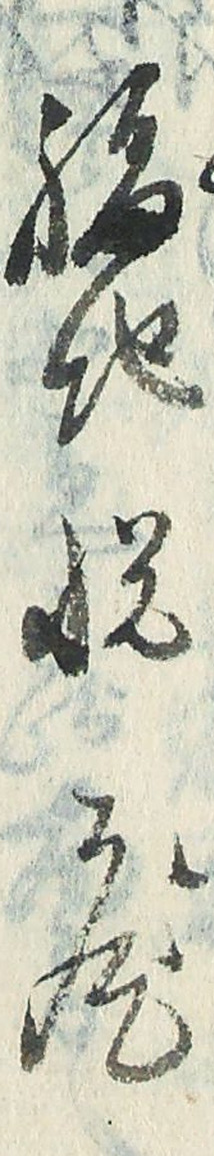福地悦蔵
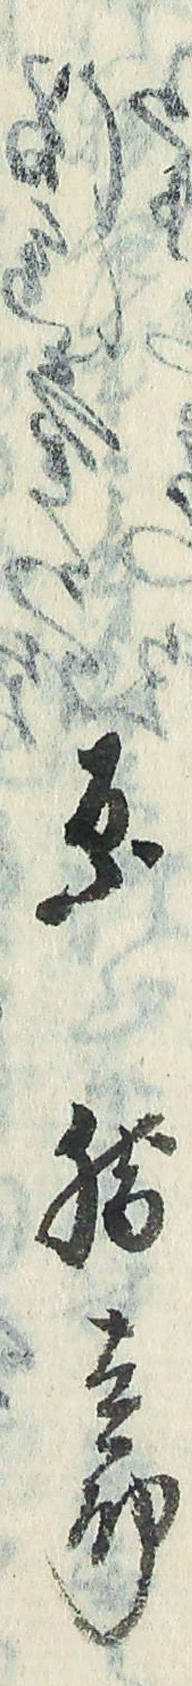原勝太郎
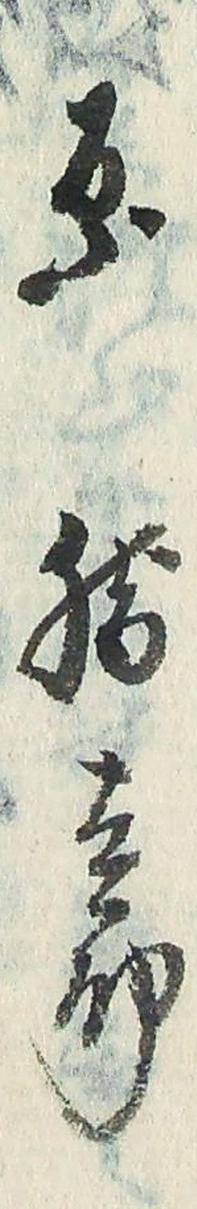原勝太郎
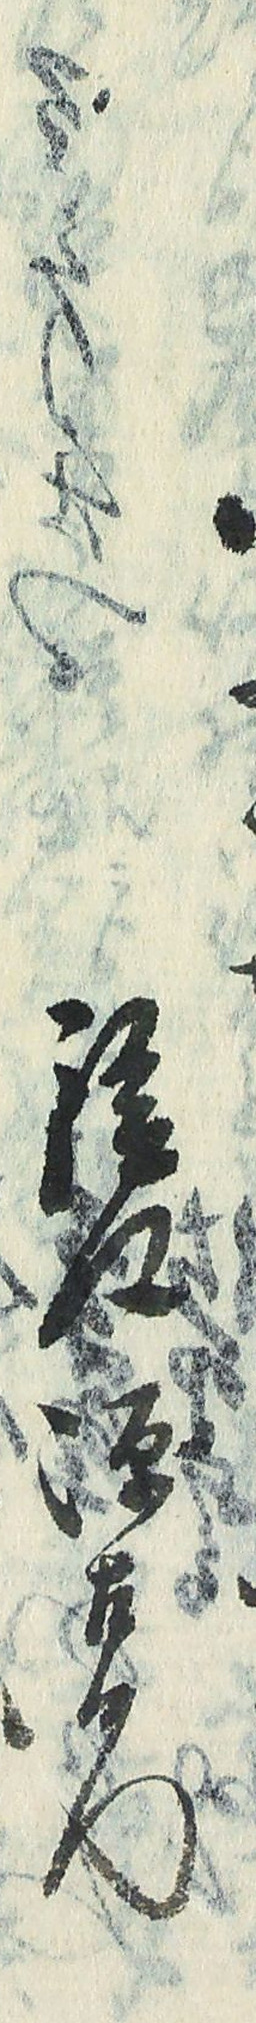鈴江源左衛門
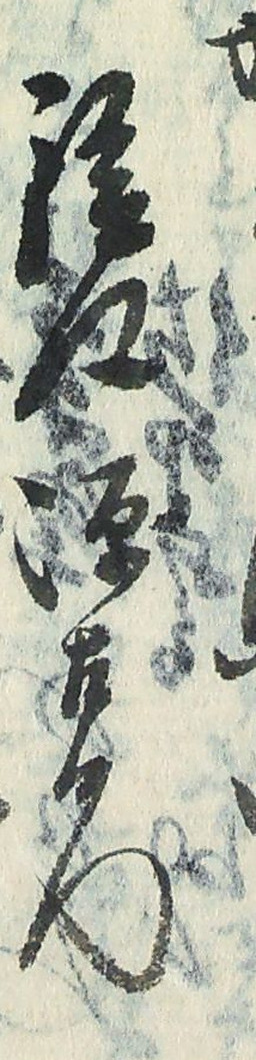鈴江源左衛門
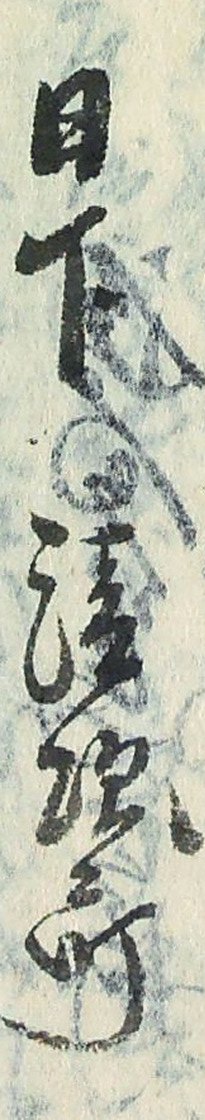日下清次郎
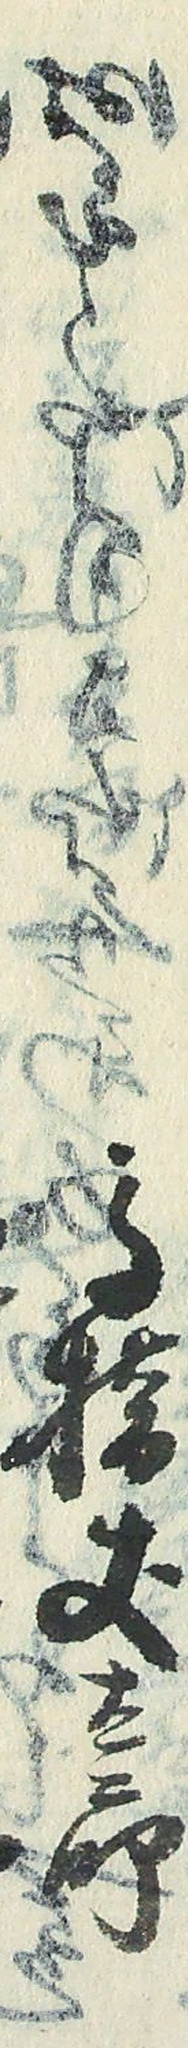高橋丈太郎
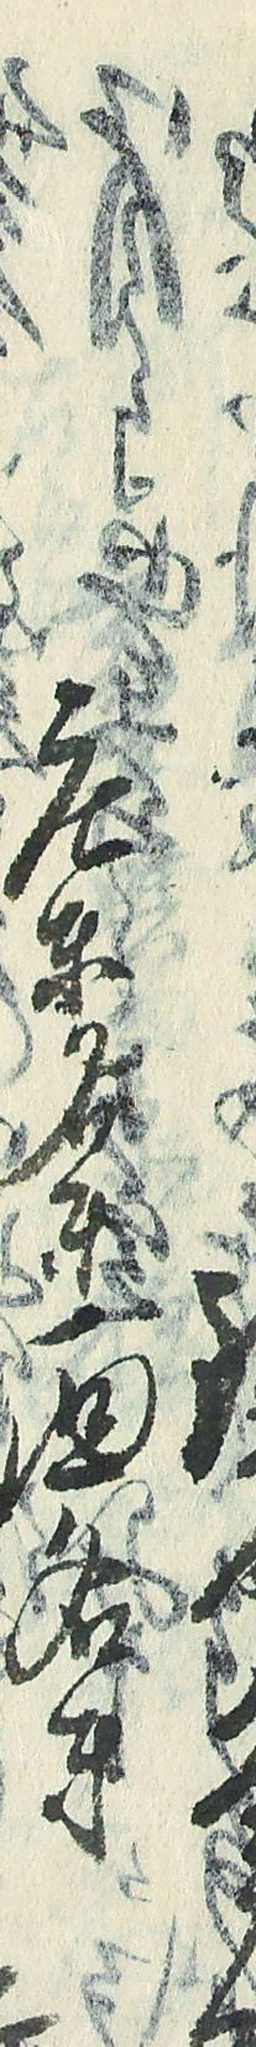庄東名東西名東
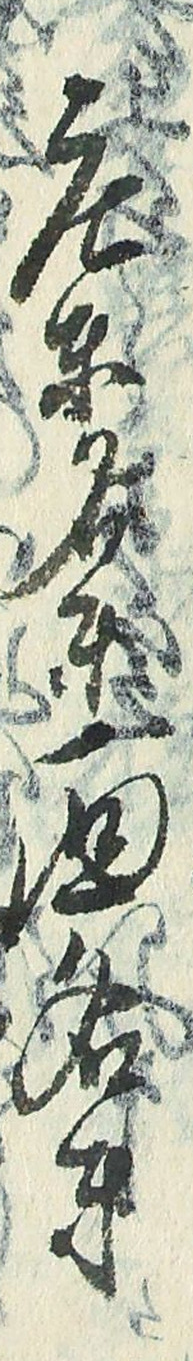庄東名東西名東
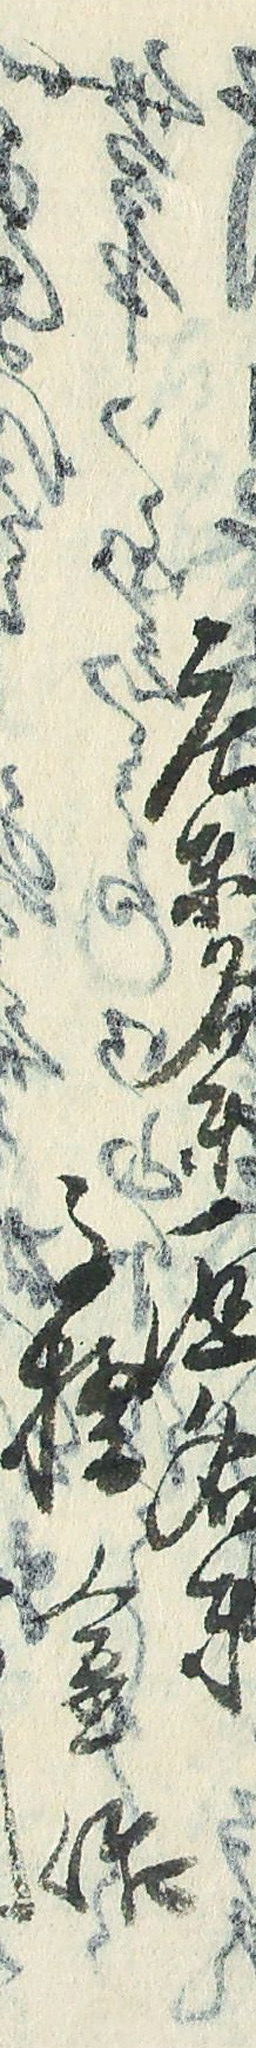高橋金作
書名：諸御趣意書并御下知向之写
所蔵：鳴門教育大学 Naruto University of Education
